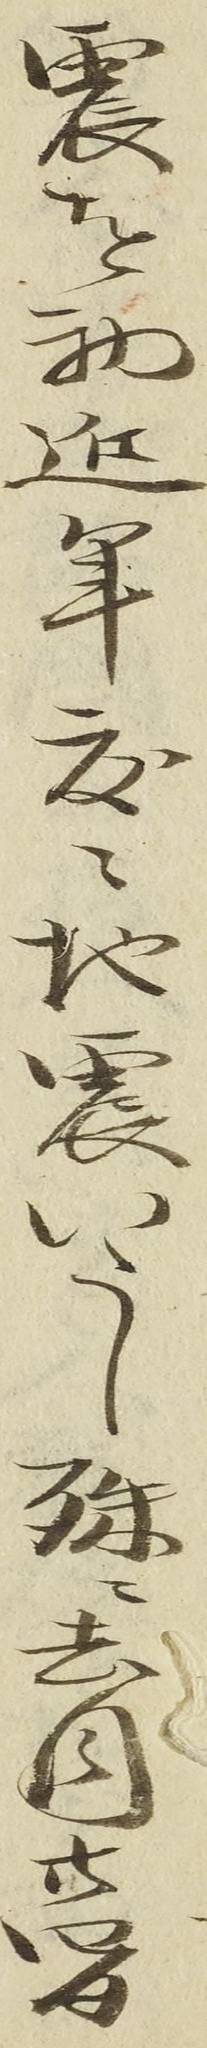震を初近年度々地震いたし殊二去付廿四日
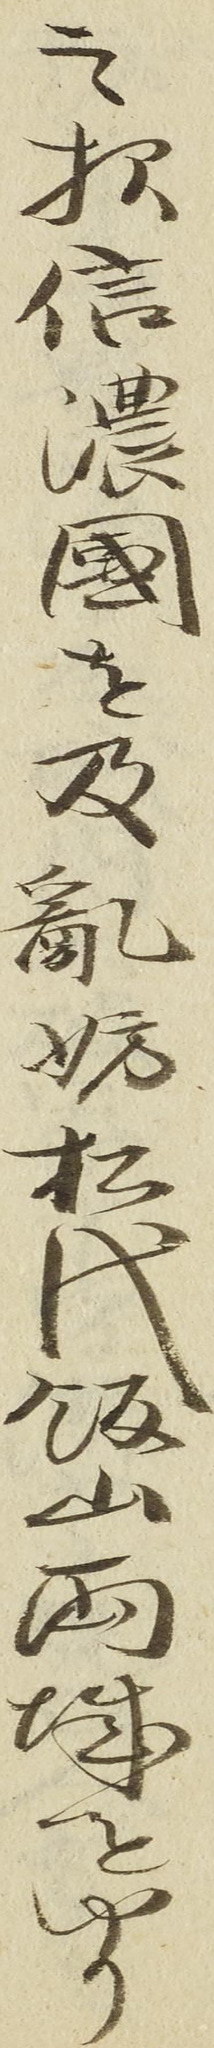之夜信州之国を及乱妨松代飯山両城をゆり
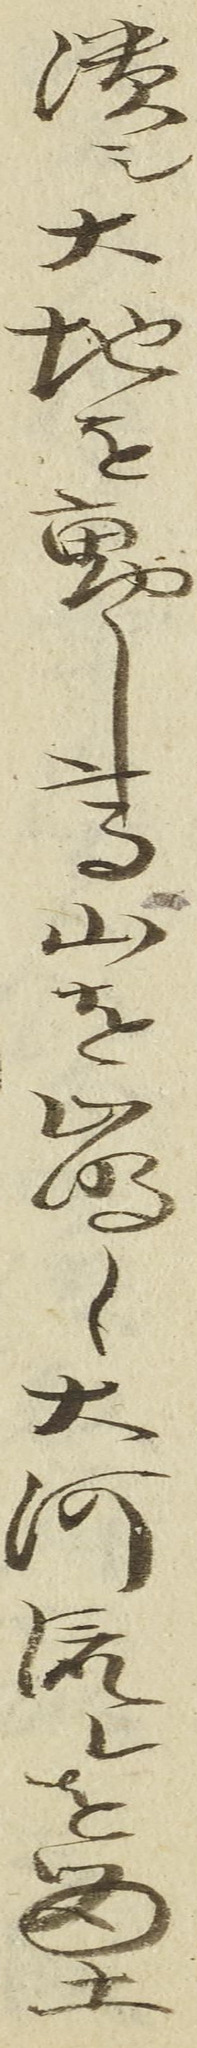潰し大地ヲ動し高山を崩し大河流ㇾを留土
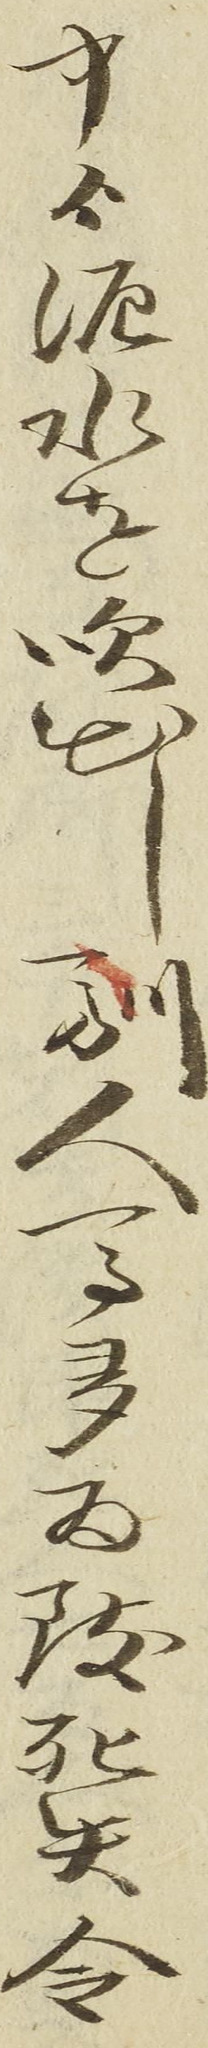中ゟ泥水を吹出し剰人馬多為致死失令
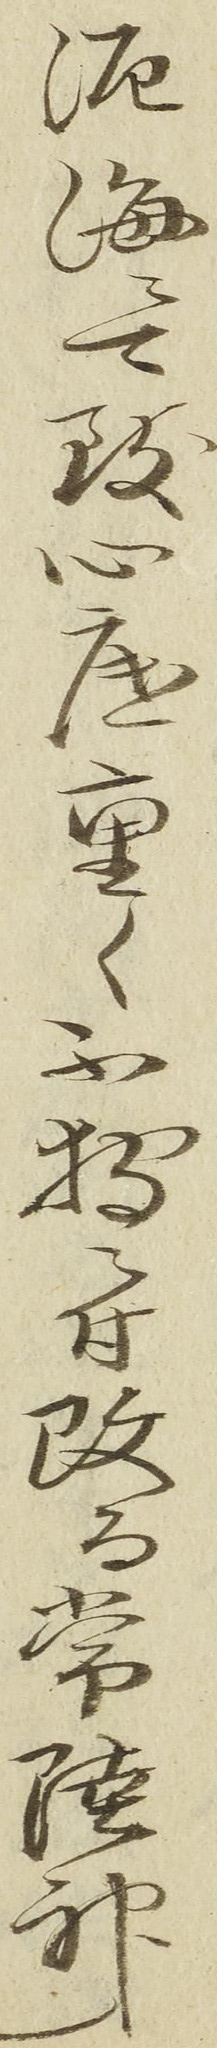泥海二可致心底重々不埒二付改而常陸神
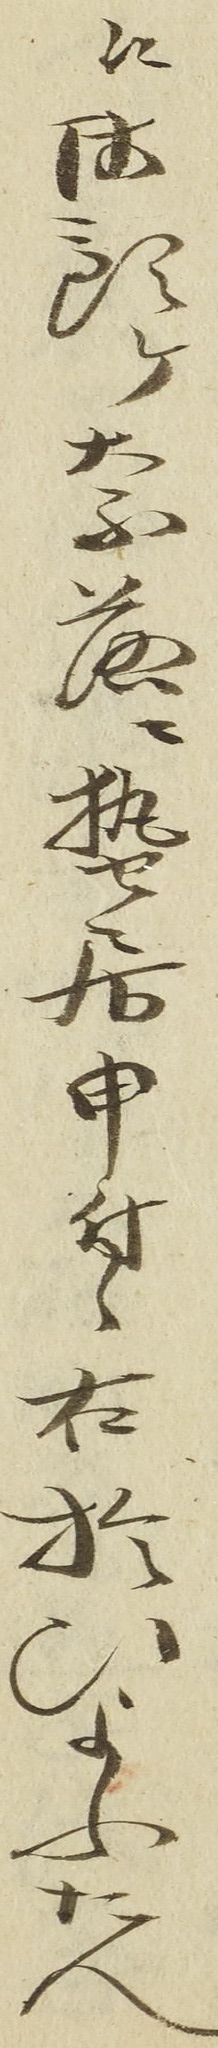江御預奈落二蟄居申付候右於ひよふたん
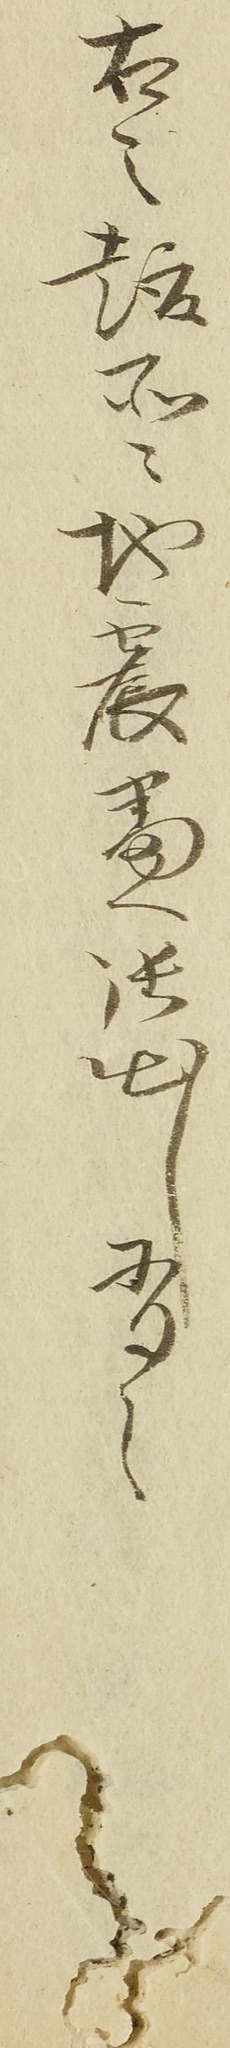右之趣所々地震番へ張出し有之
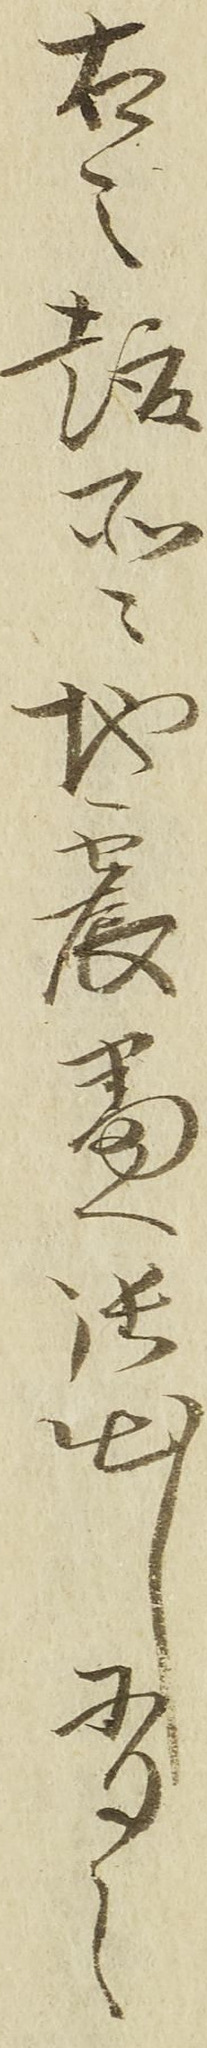右之趣所々地震番へ張出し有之

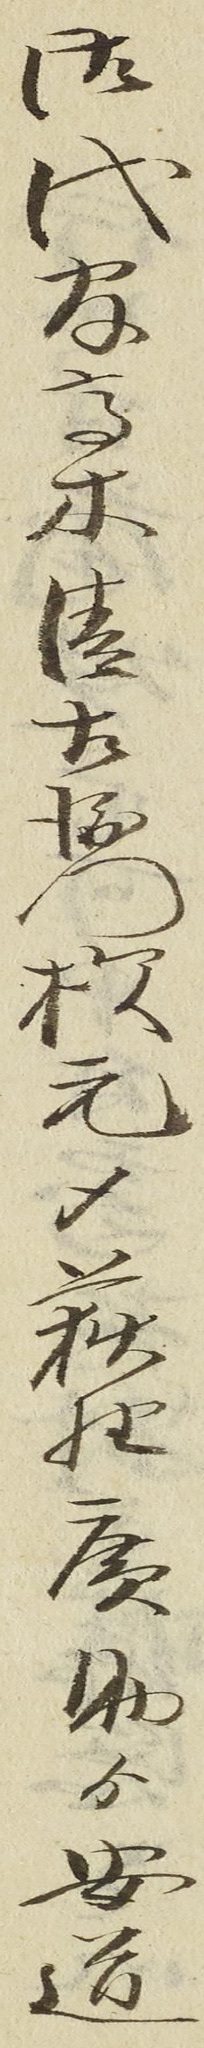御代官高木清左衛門様元〆萩野廣助安道
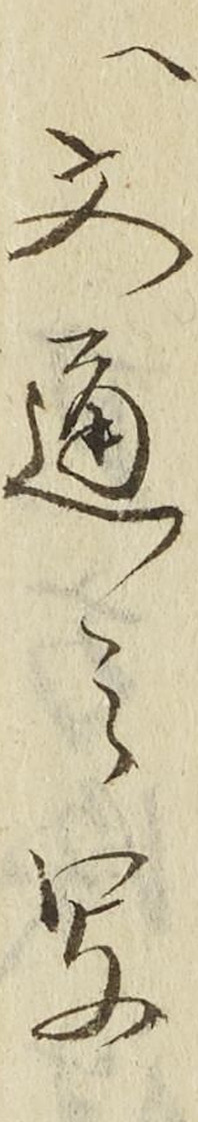文通之写
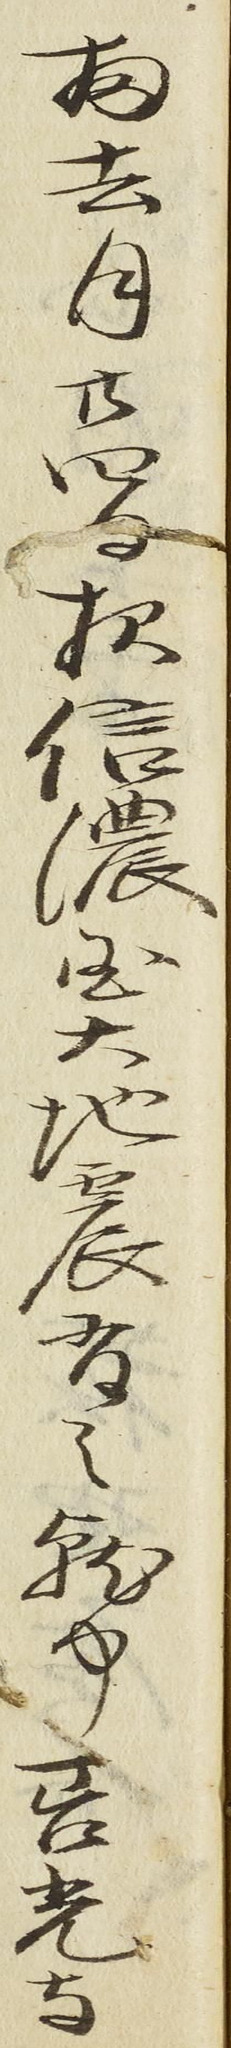扨去月廿四日夜信濃国大地震有之就中善光寺
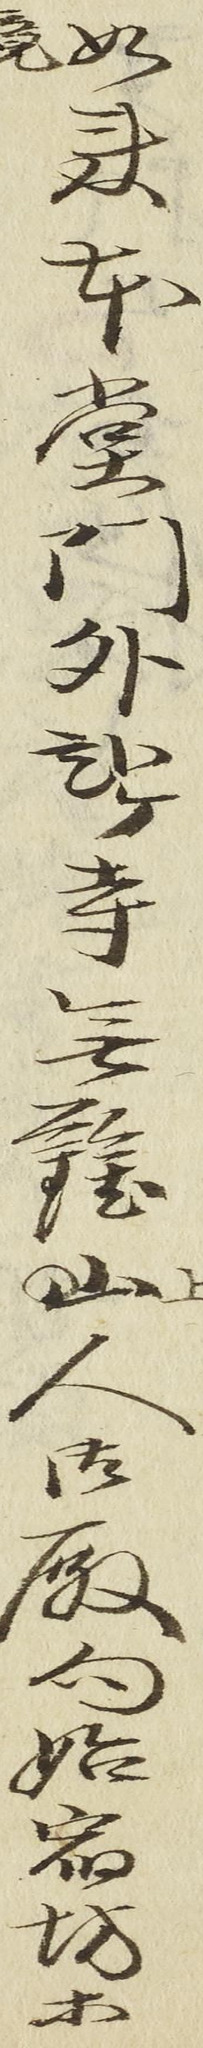如来本堂外弐ヶ寺無難上人御殿向始宿坊等
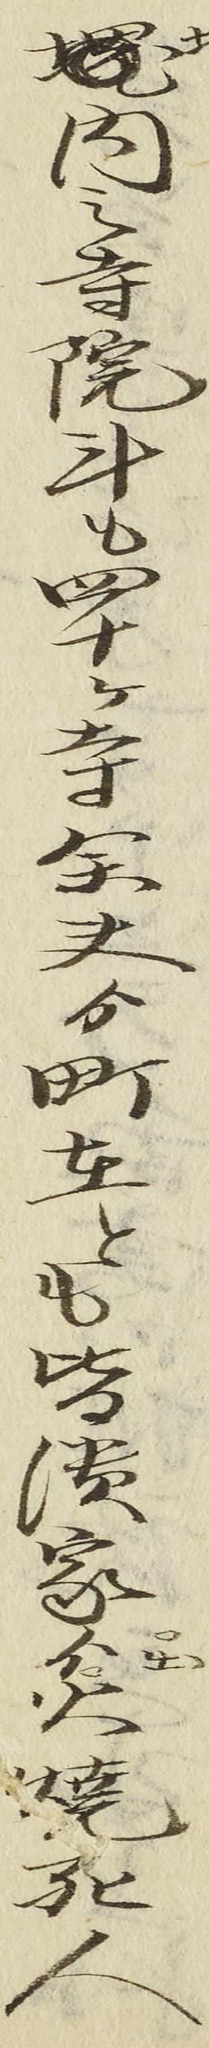境内之寺院斗も四十ヶ寺余夫ゟ町在とも皆潰家ゟ出火焼死人
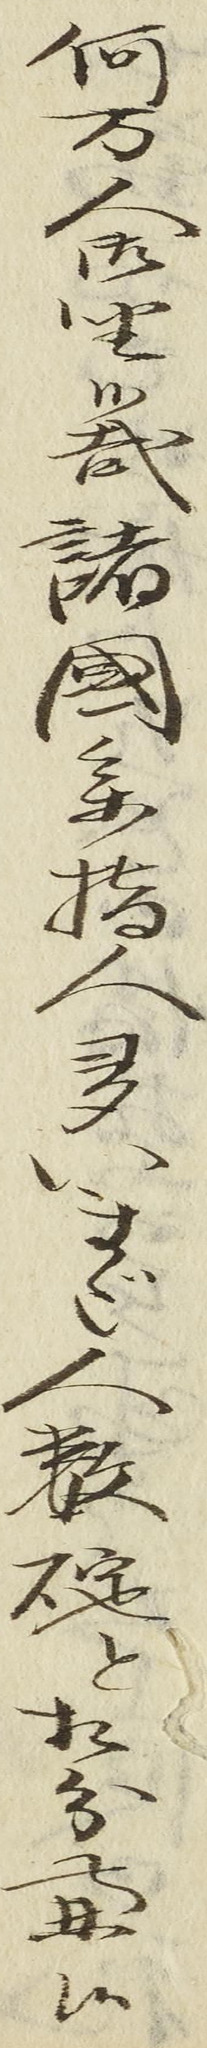何万人御坐候哉諸国参詣人多いまだ人数聢と相分兼候
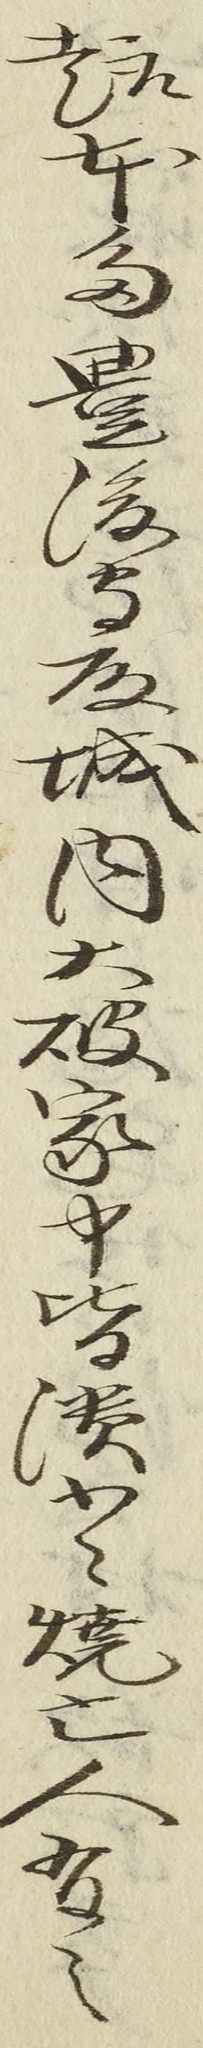趣本多豊後守殿城内大破家中皆潰少々死亡有之
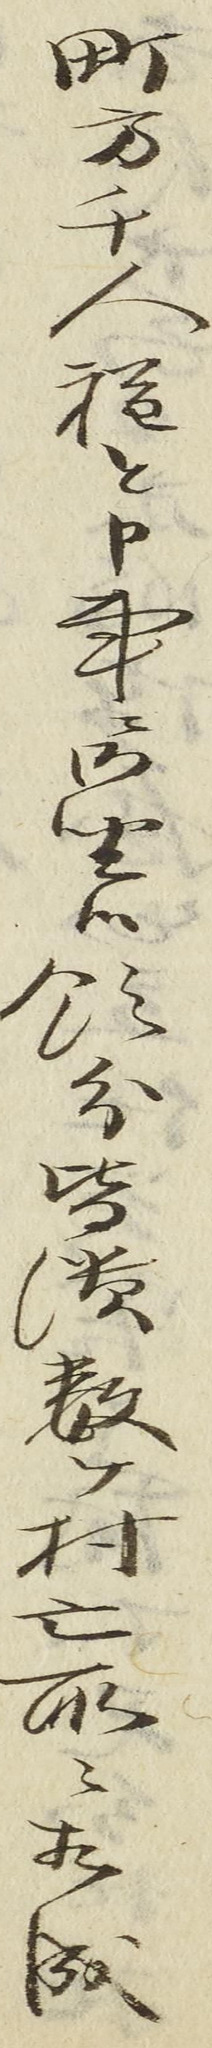町方千人程と申事二御坐候領分皆潰数ヶ村亡所二相成
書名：信濃國大地震記　乾
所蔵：東京大学地震研究所図書室 Earthquake Research Institute Library, The University of Tokyo, JAPAN
